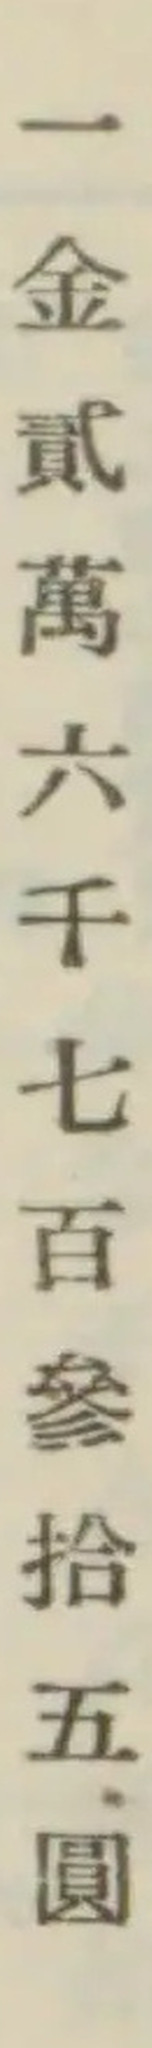一金貳萬六千七百參拾五圓
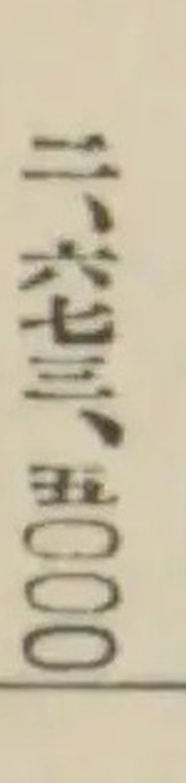計二、六七三、五〇〇〇

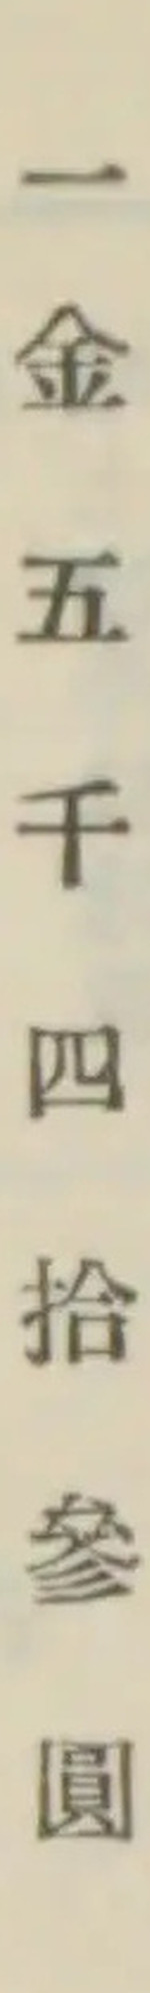一金五千四拾參圓
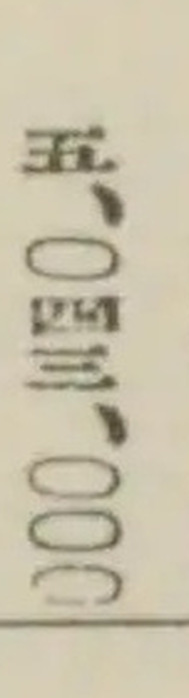計五、〇四三、〇〇〇
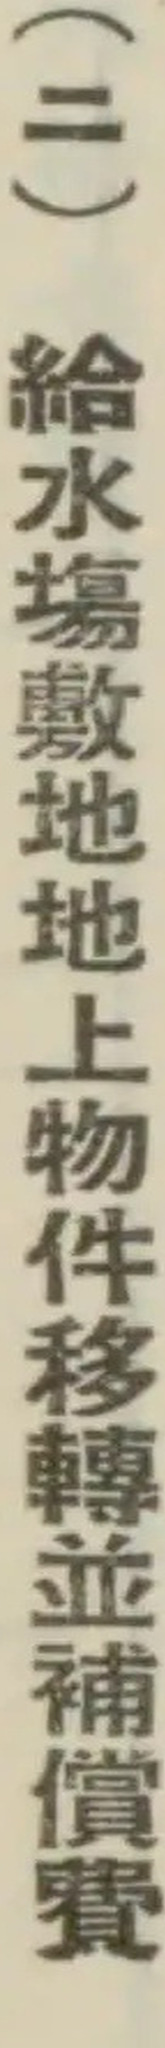(ニ)給水場敷地地上物件移轉並補償費
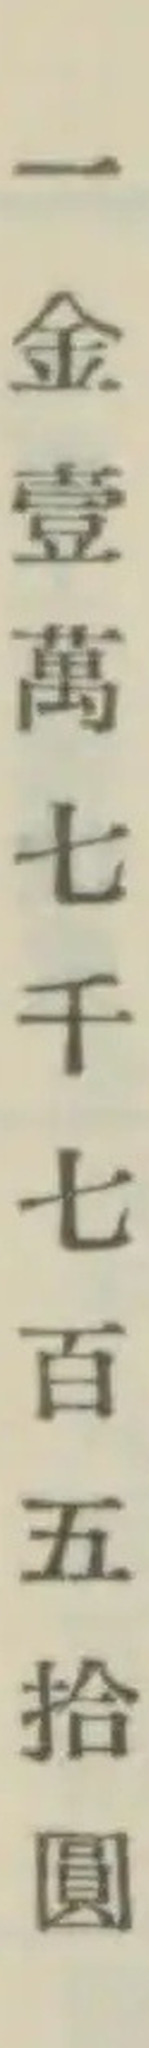一金壹萬七千七百五拾圓
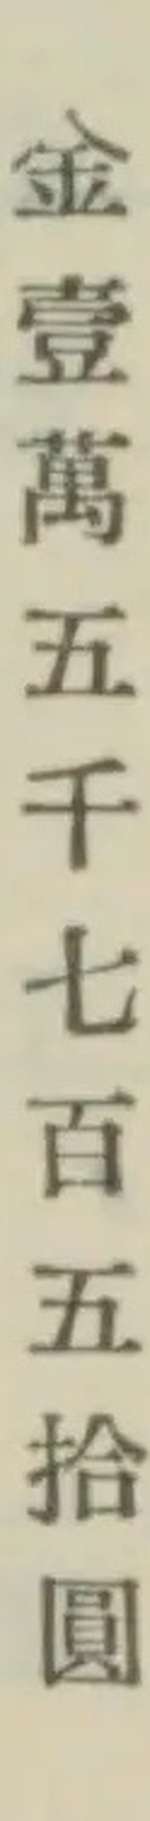一金壹萬七千七百五拾圓
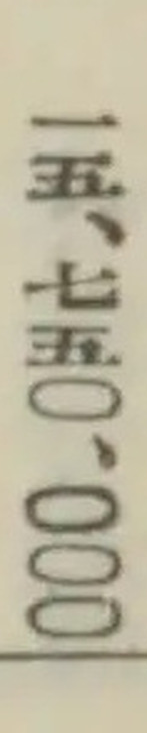計一七、七五〇、〇〇〇
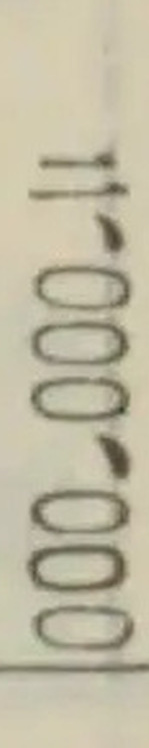計五、〇四三、〇〇〇
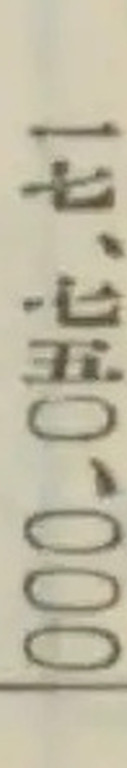計一七、七五〇、〇〇〇
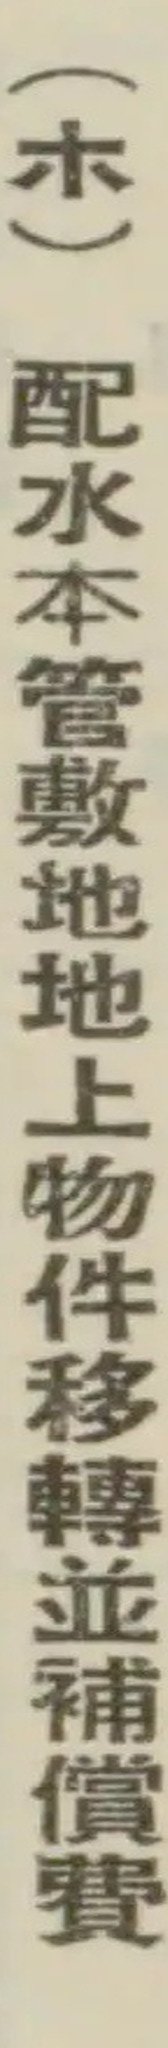(ホ)配水本管敷地地上物件移轉並補償費
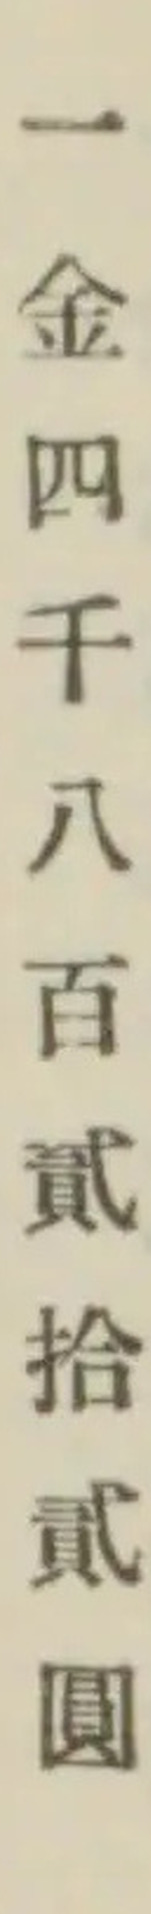一金四千八百貳拾貳圓
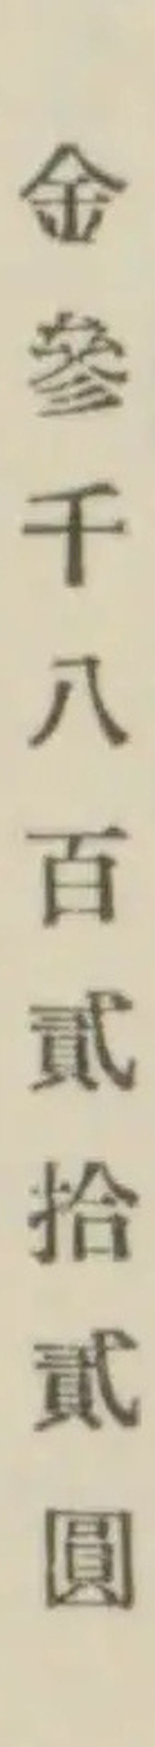一金四千八百貳拾貳圓
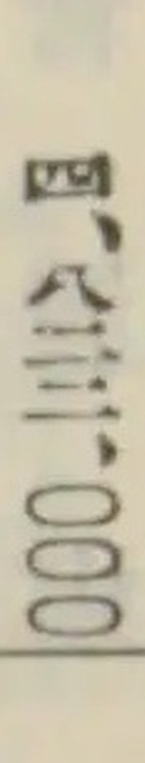計四、八二二、〇〇〇

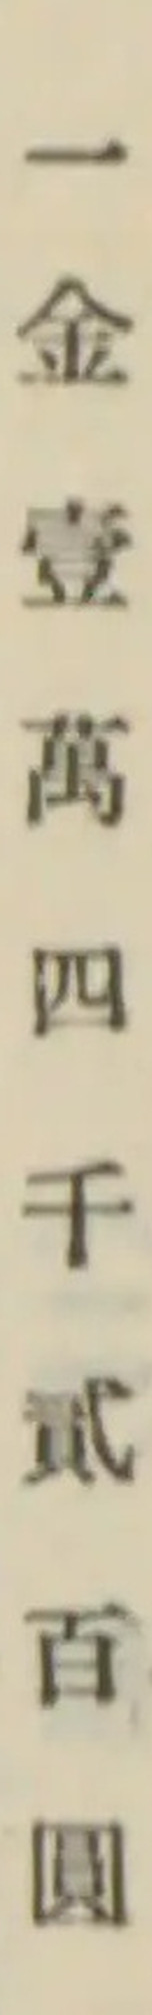一金壹萬四千貳百圓
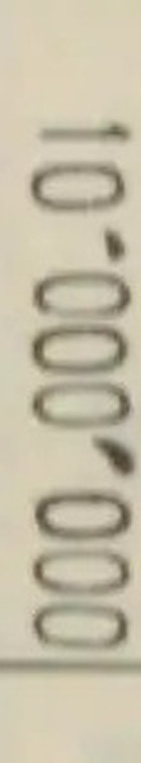計一四、〇〇〇、〇〇〇
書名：豊橋市水道誌
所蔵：国立国会図書館 National Diet Library, JAPAN
